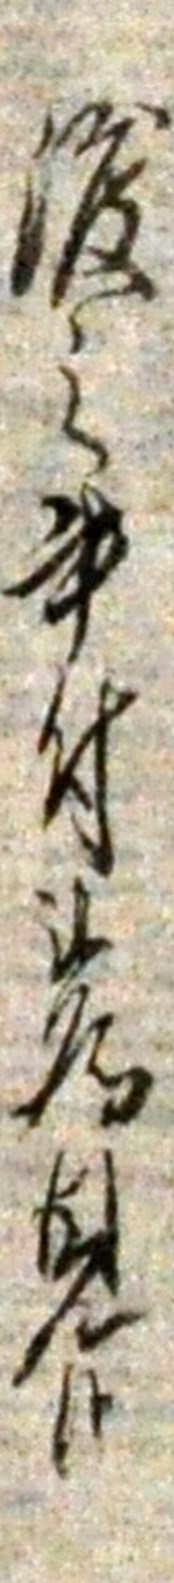渡之書付被為見候

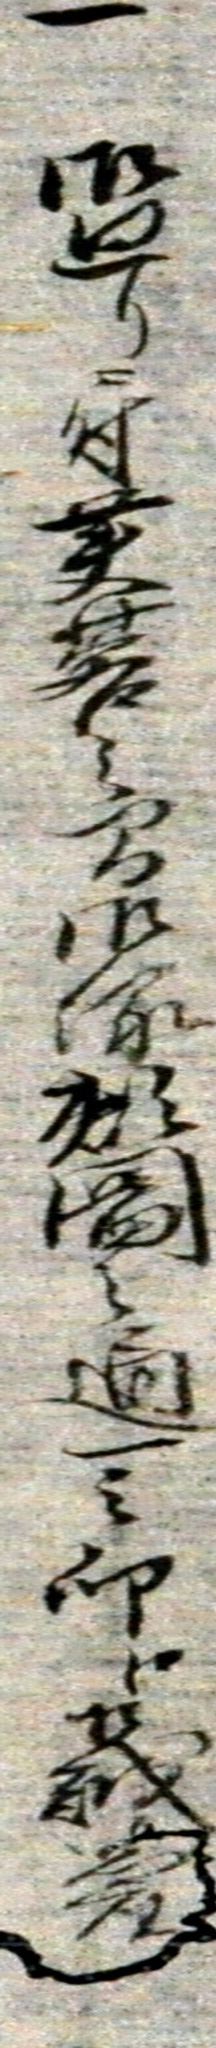一御廻りニ付芙蓉之間御縁頬図之通一之印え相越而着座
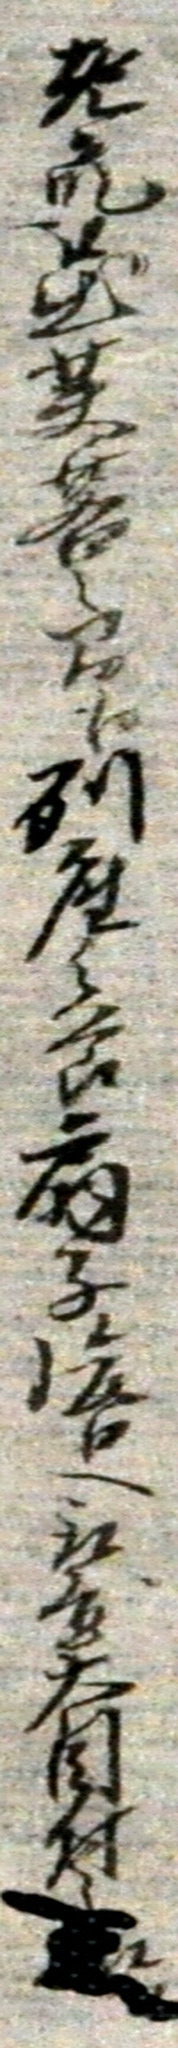老衆被出芙蓉之間え列座之節扇子後ロヘ取置大目付之
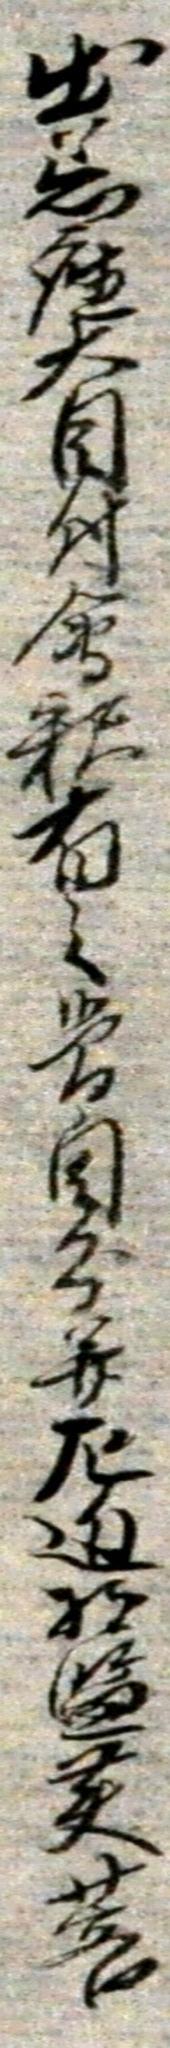出着座大目付会釈有之候間自分并左近将監芙蓉
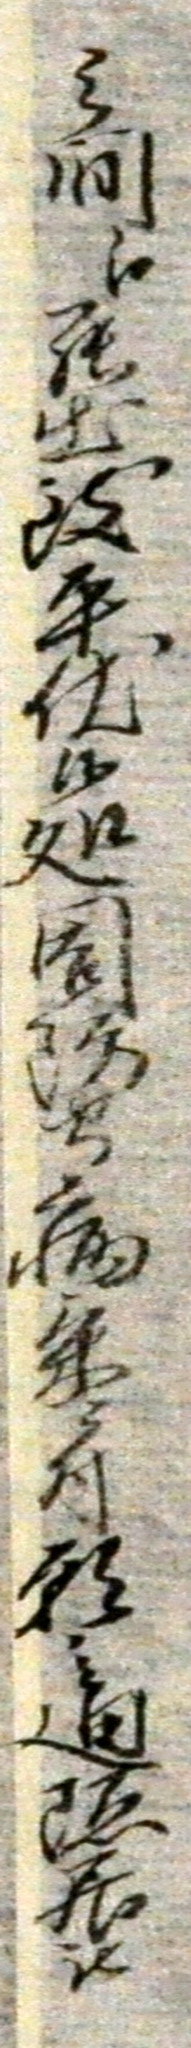之間え罷出致平伏候処周防守病気ニ付願之通隠居被
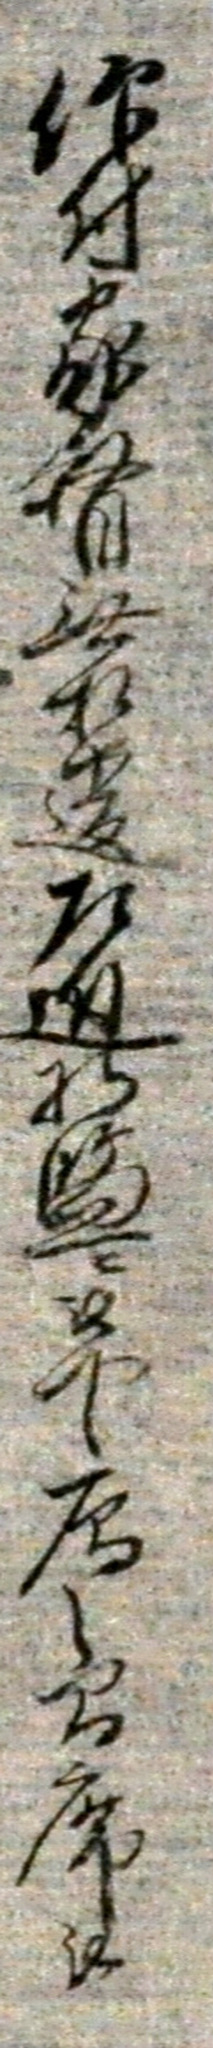仰付家督無相違左近将監ニ被下雁之間席被
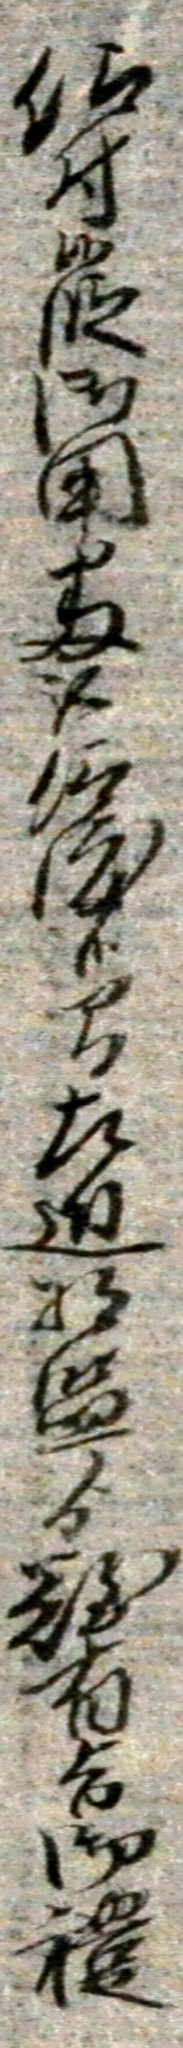仰付候段御用番被仰渡候間左近将監ゟ難有旨御礼
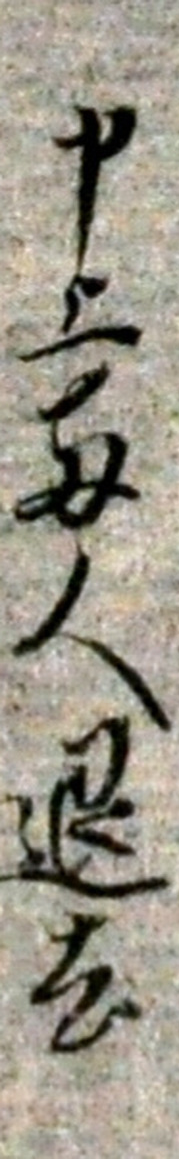申上両人退去
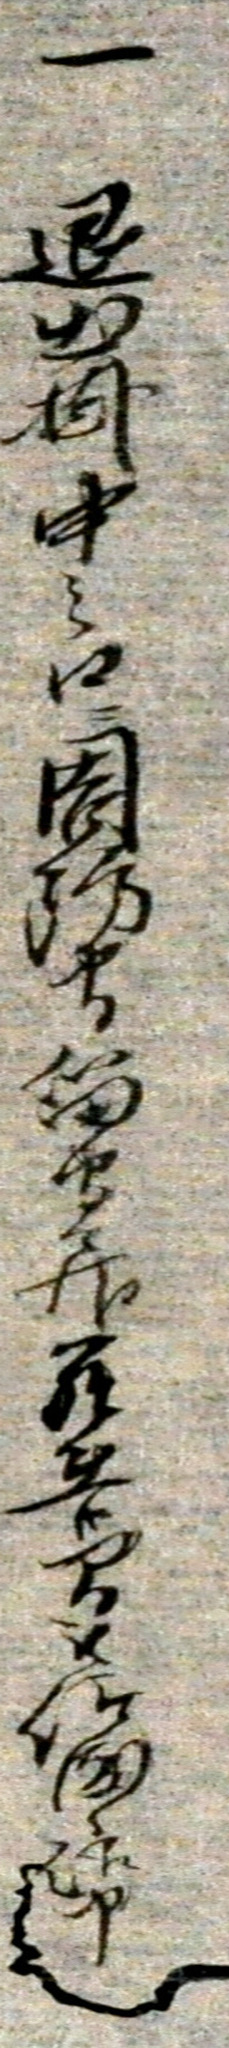一退出掛中之口ニ周防守留守居罷在候間被仰渡之趣申
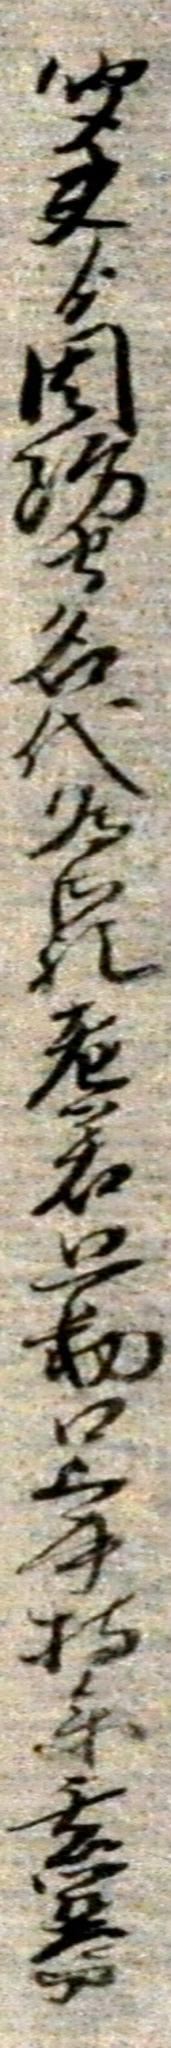聞夫ゟ周防守名代為御礼老若廻勤口上書持参玄関ニ而
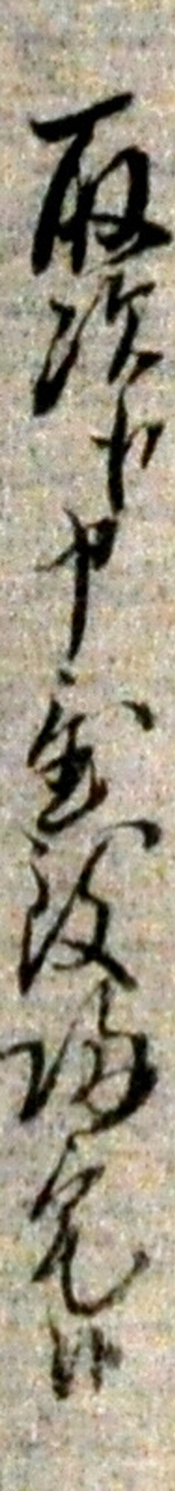取次へ申置致帰宅候
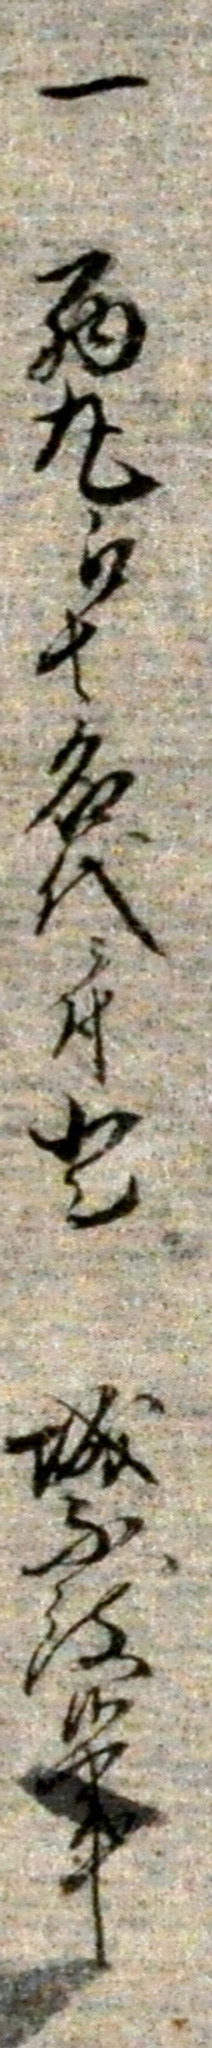一西丸えは名代ニ付登城不致候事
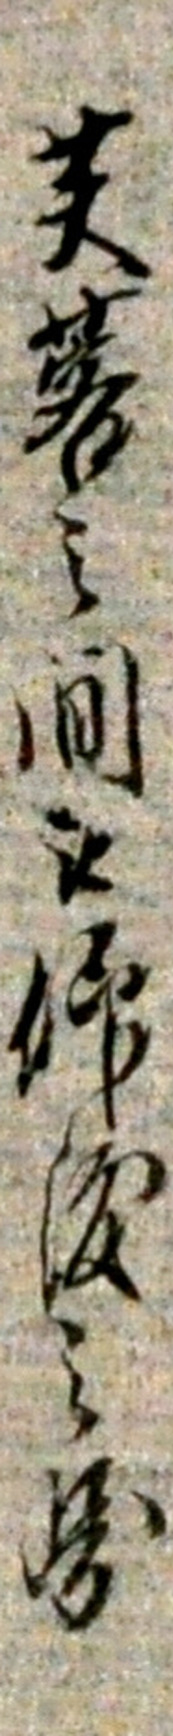芙蓉之間被仰渡之図
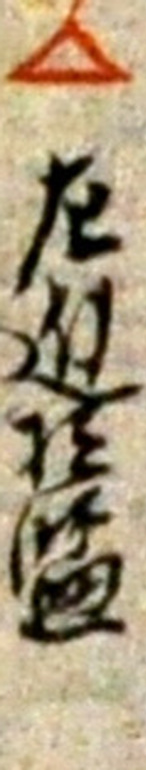△左近将監
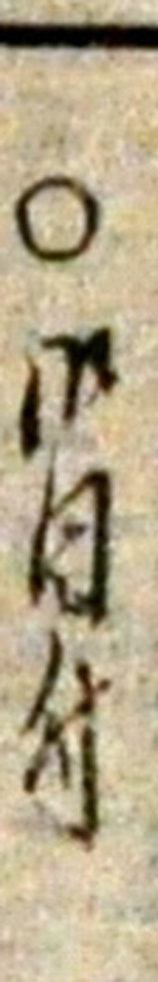○御目付
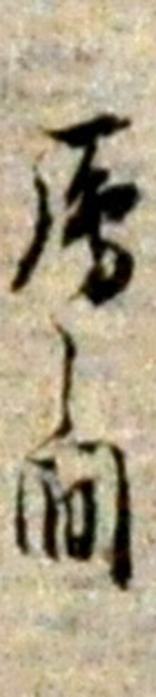雁之間
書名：諸名代相勤候節ノ留書外
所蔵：伊那市立高遠町図書館・合同会社AMANE
